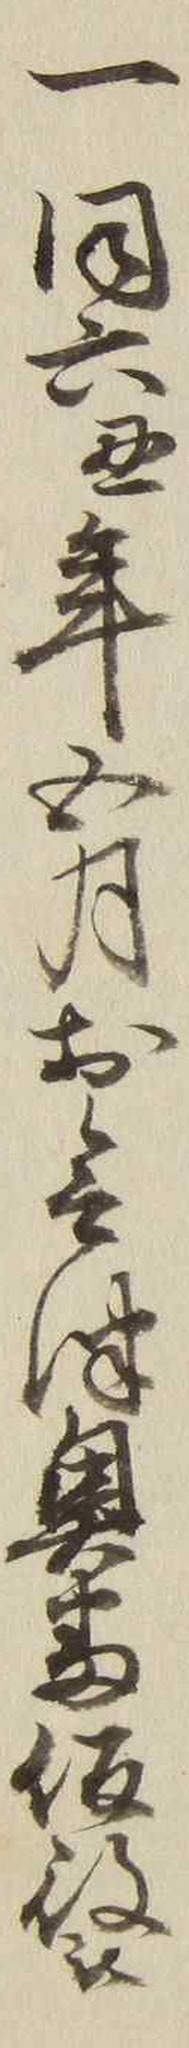一同六丑年五月於会津奥番仮役被

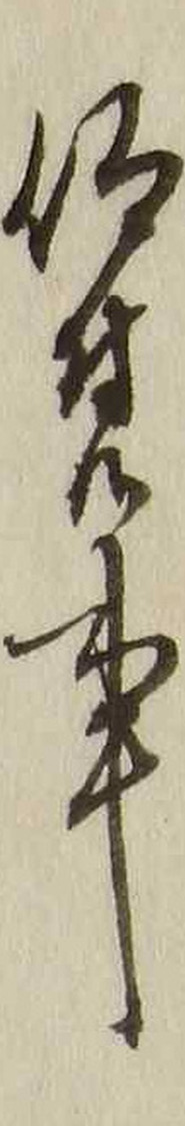仰付候事
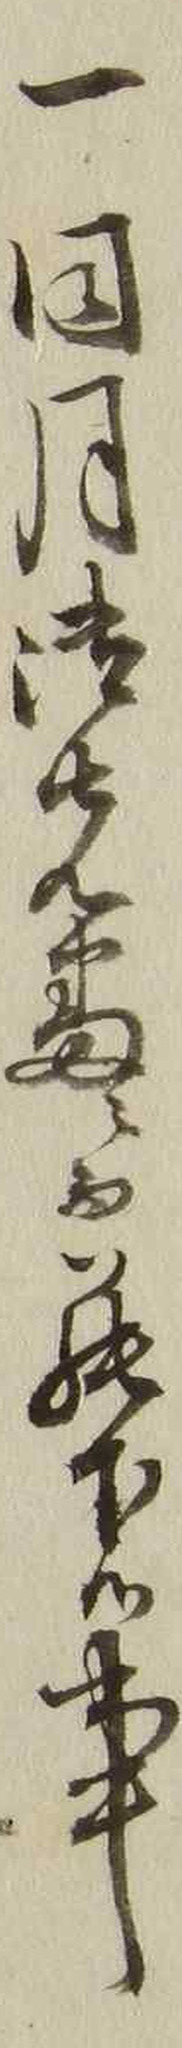一同月御先番ニ而罷下候事
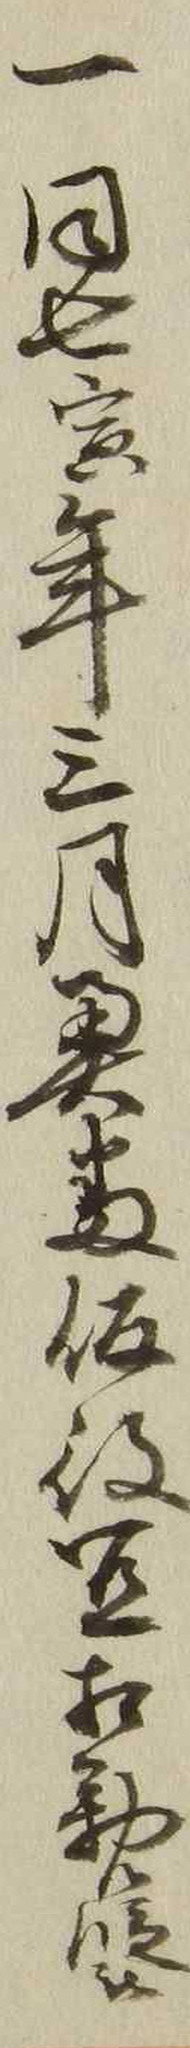一同七寅年三月奥番仮役宜相勤候段被
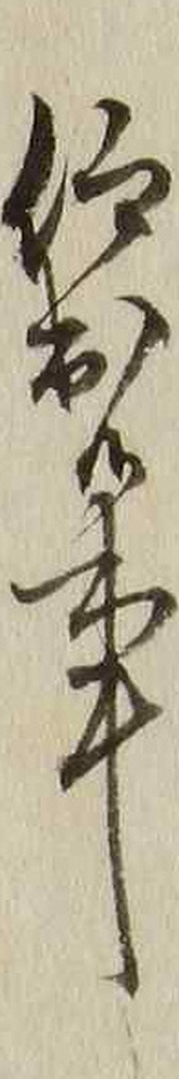仰出候事
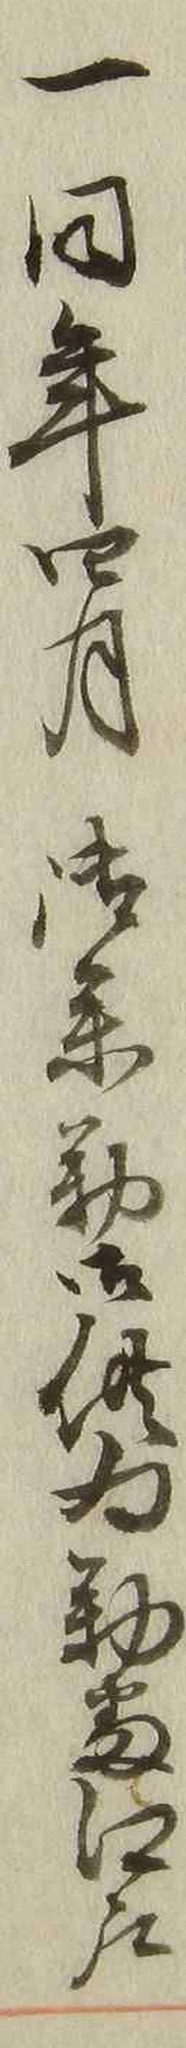一同年四月御参勤御供為勤番江戸
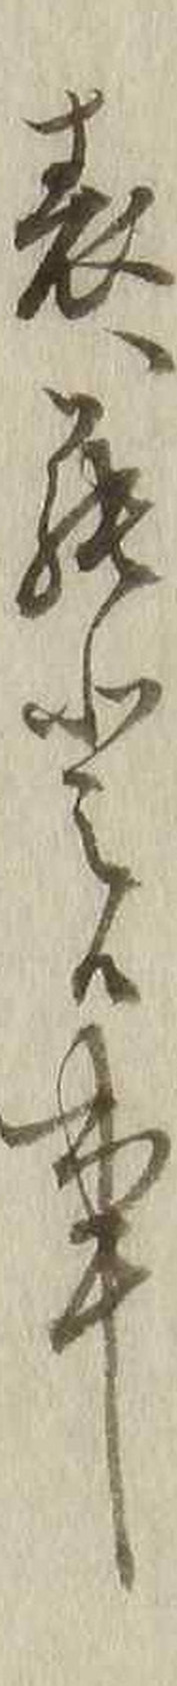表へ罷登候事
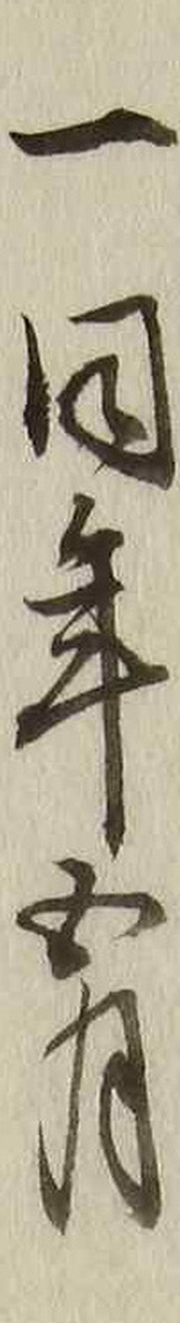一同年五月
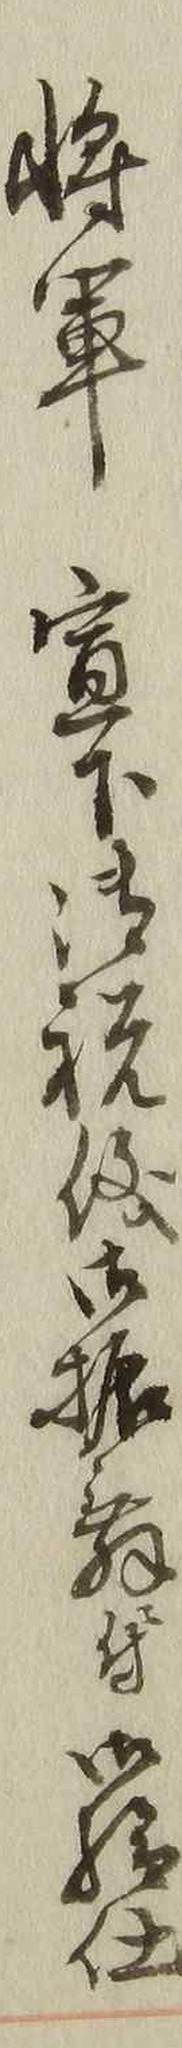将軍宣下御祝儀御振舞ニ付御給仕
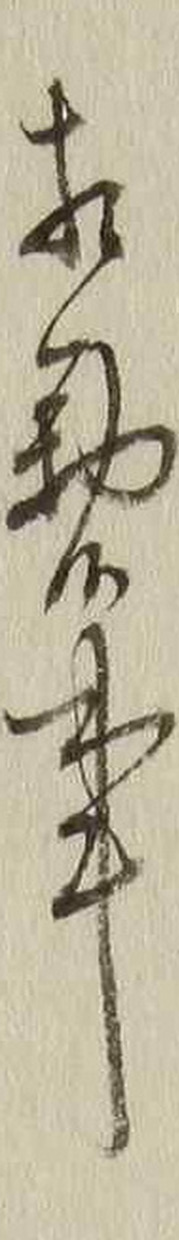相勤候事
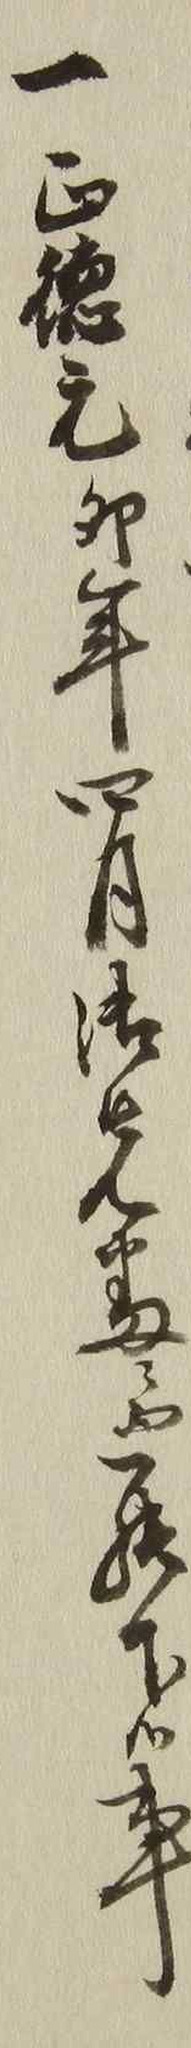一正徳元卯年四月御先番ニ而罷下候事
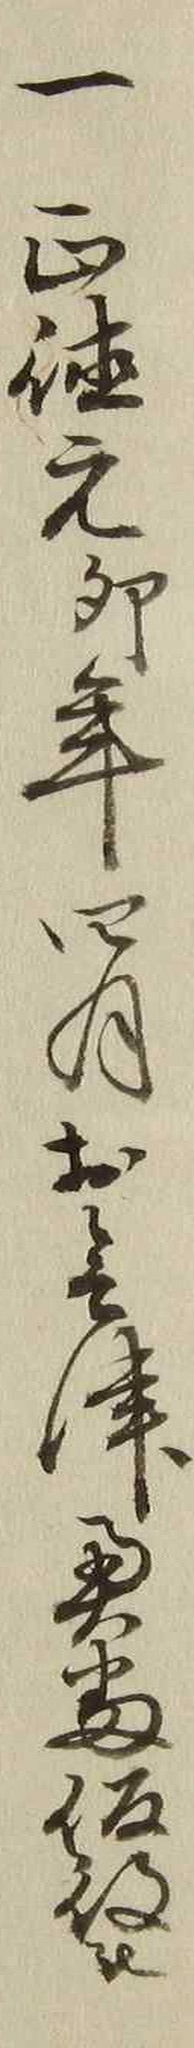一正徳元卯年四月於会津奥番仮役被
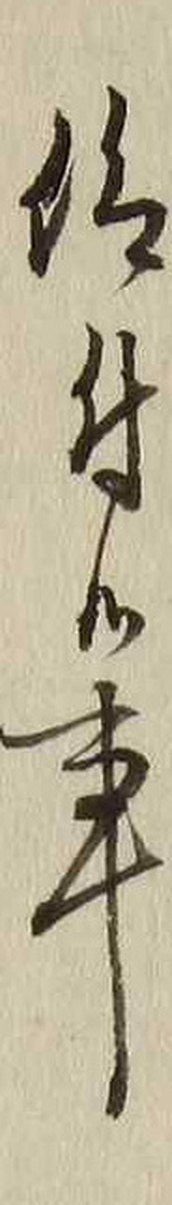仰付候事
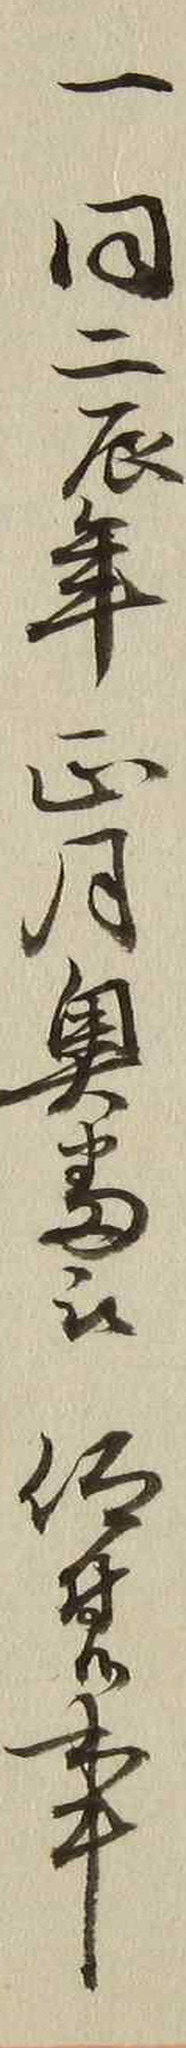一同二辰年正月奥番被仰付候事
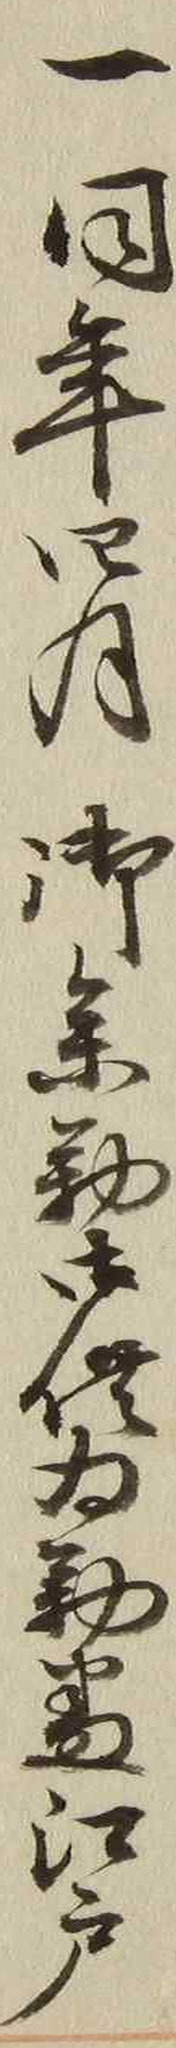一同年四月御参勤御供為勤番江戸
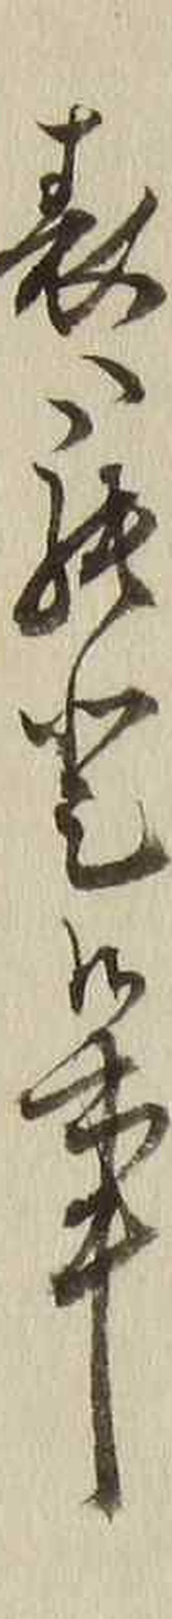表へ罷登候事
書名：諸士系譜　巻之23　い之部23
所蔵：会津若松市立会津図書館
